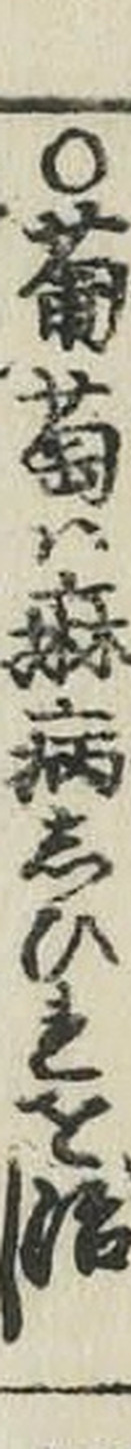○葡萄は痳病しひれを治し
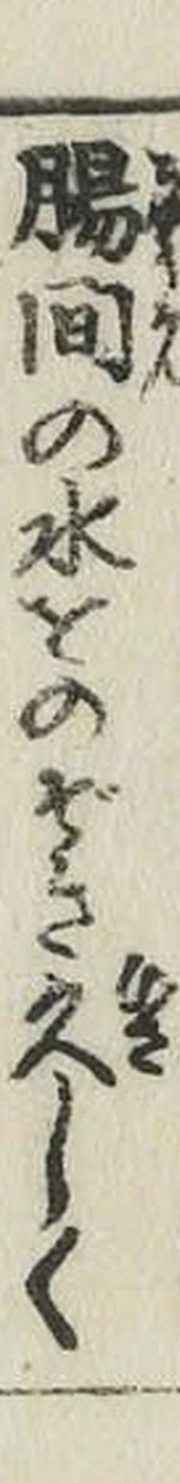腸間の水をのぞき久しく
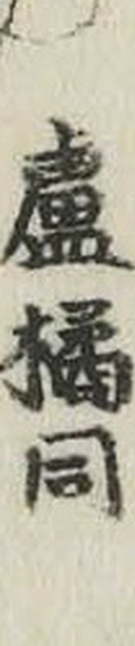盧橘同
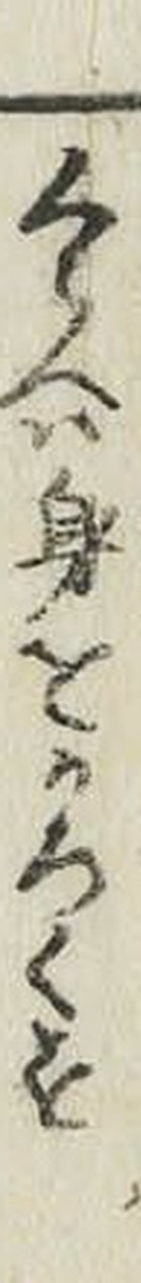くらへは身をかろくす
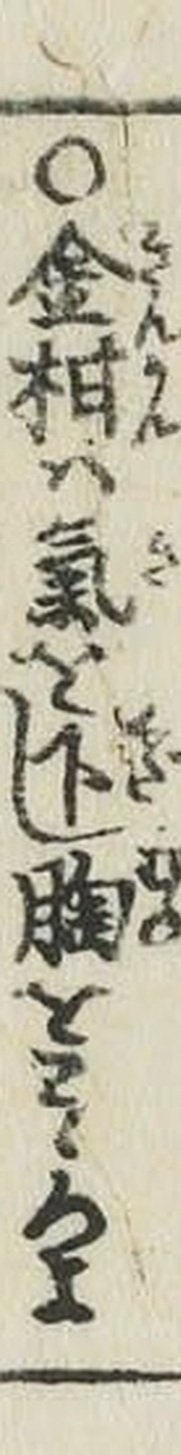○金柑は気を下し胸をこゝろよ
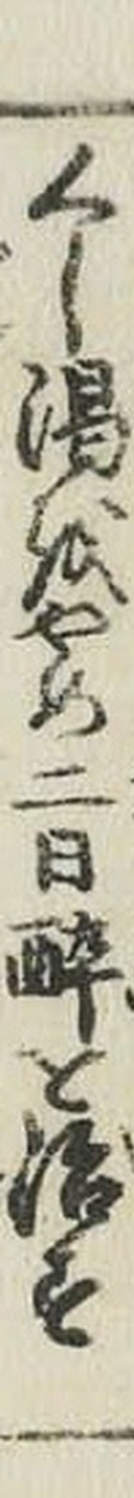くし渇をやめ二日酔を治す
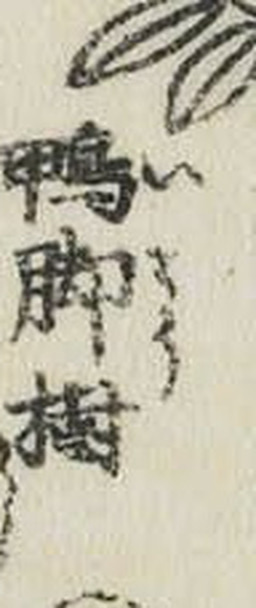鴨脚樹
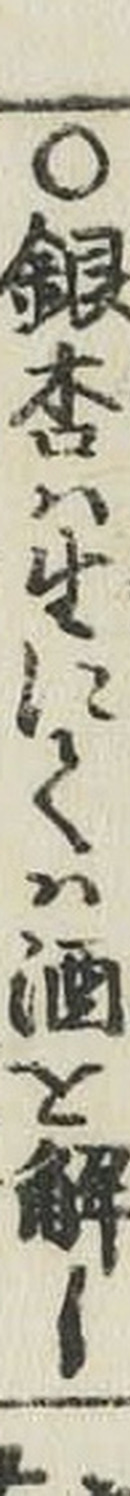○銀杏は生にては酒を解し
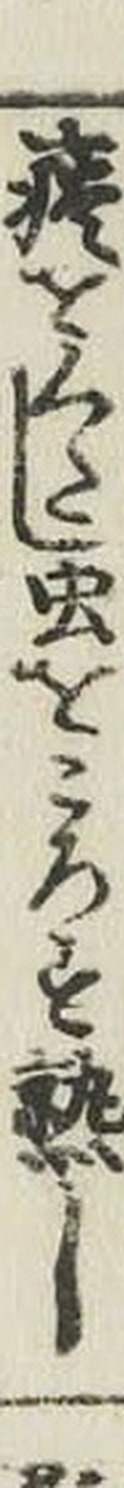痰をくたし虫をころす熟し
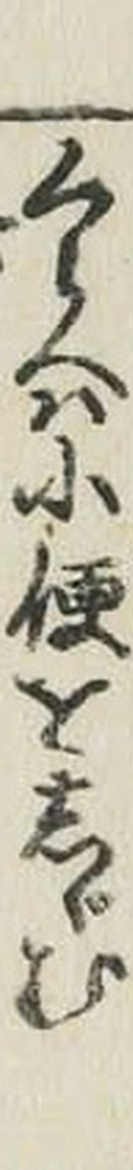くらへは小便をしゞむ
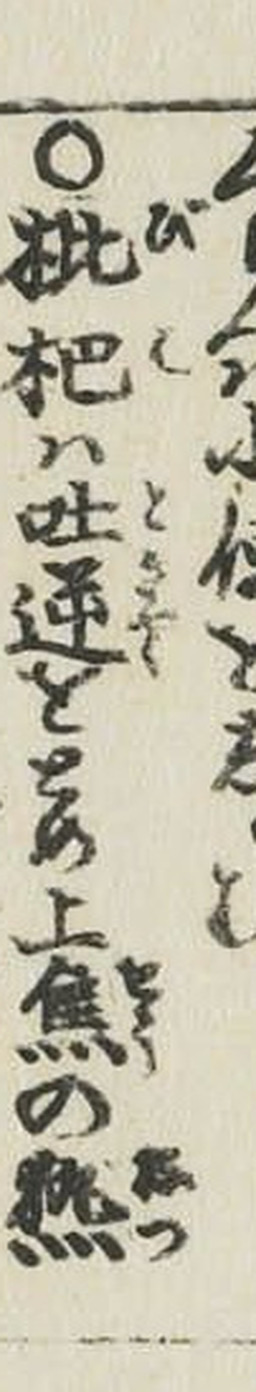○枇杷は吐逆をとめ上焦の熱
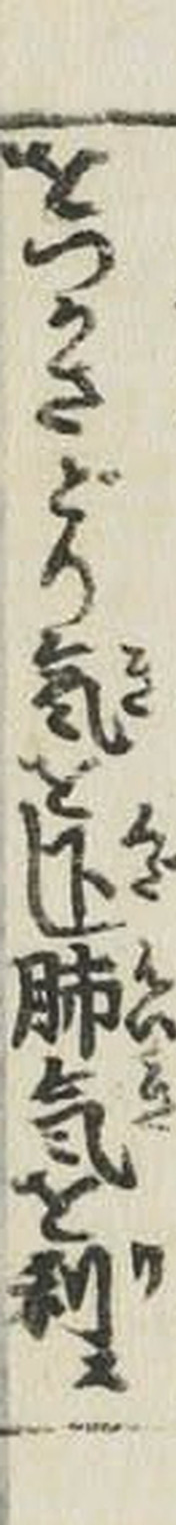をつかさどり気を下し肺気を利ス
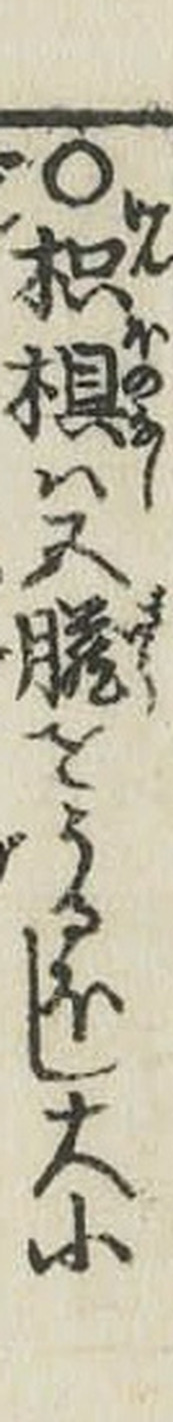○枳椇は五臓をうるほし大小
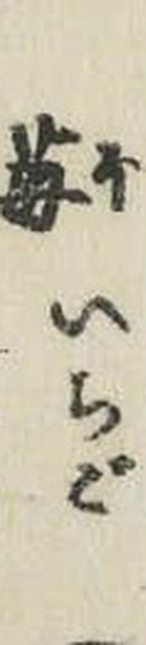苺いちご
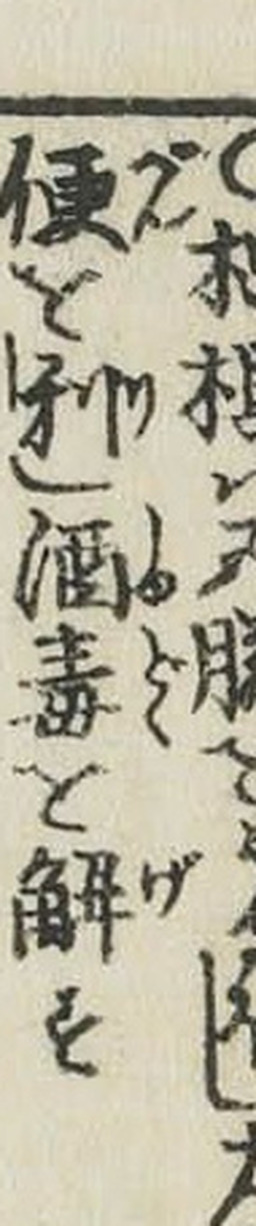便を利し酒毒を解す
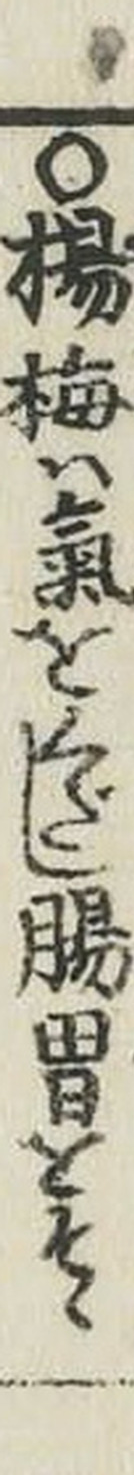○楊梅は気をくだし腸胃をそゝ
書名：増補頭書訓蒙図彙大成 10巻 8:巻之17-19
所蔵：東京学芸大学教育コンテンツアーカイブ
